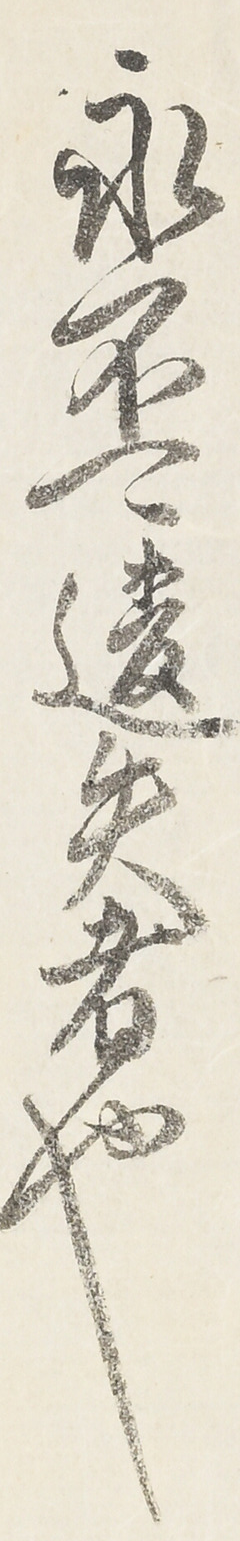永不可違失者也
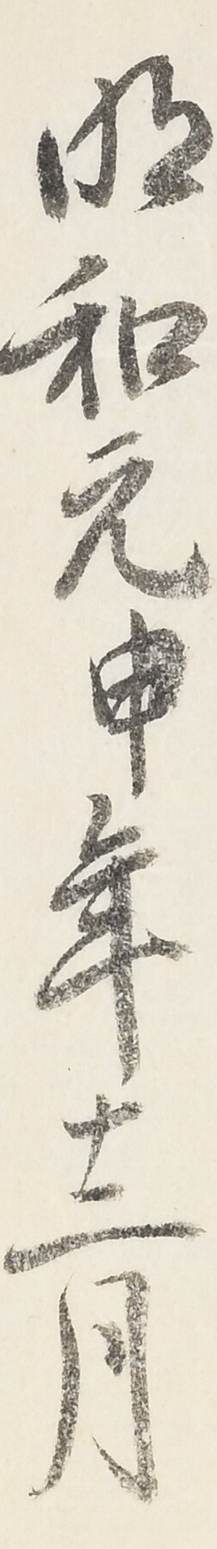明和元申年十二月
